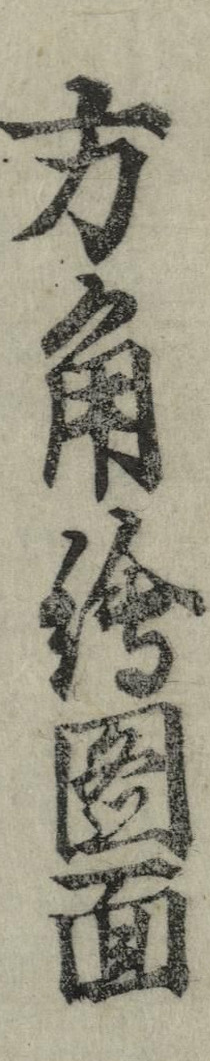方角絵図面
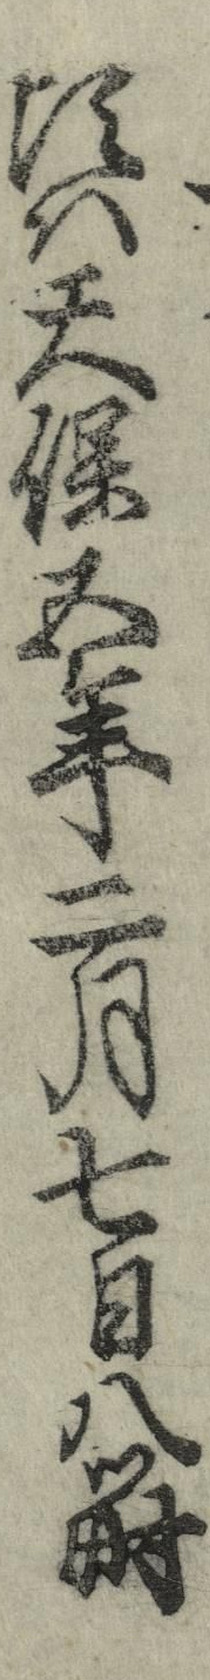頃は天保五年二月七日八ツ時
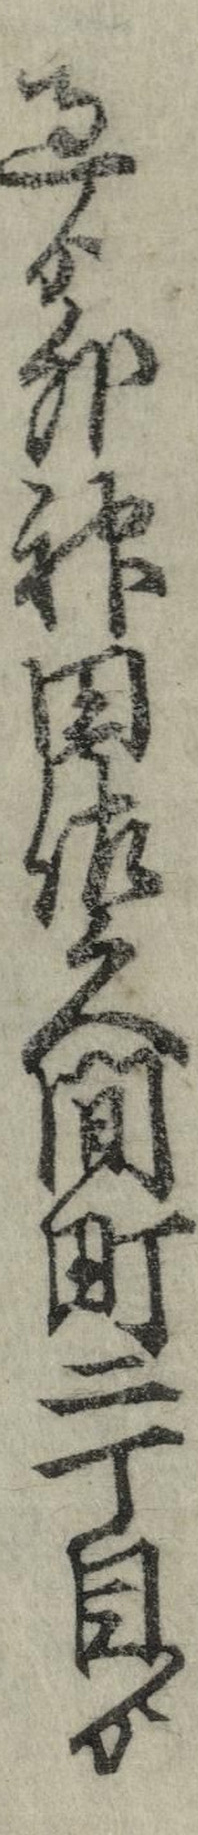過より外神田佐久間町二丁目より
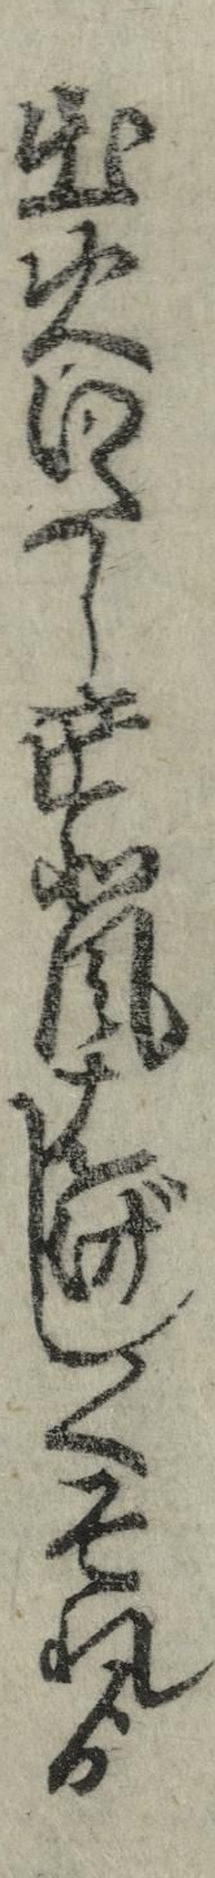出火いたし西北風はげしくそれより
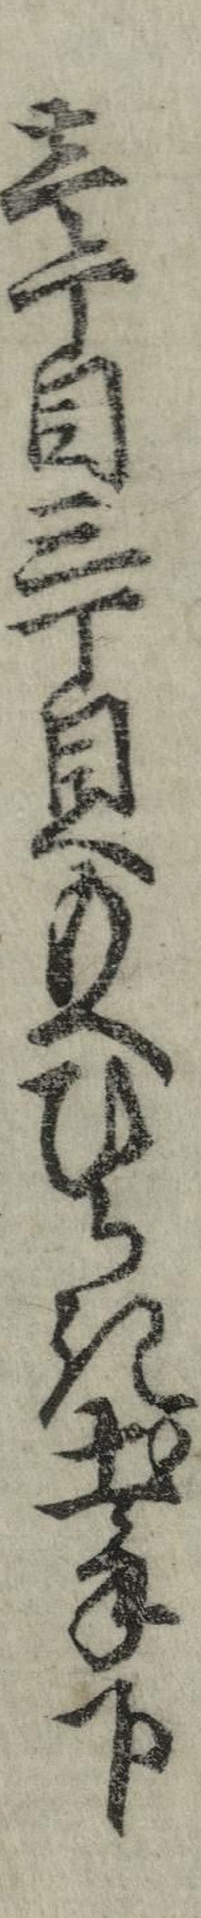壱丁目三丁目へもへひらき土手下
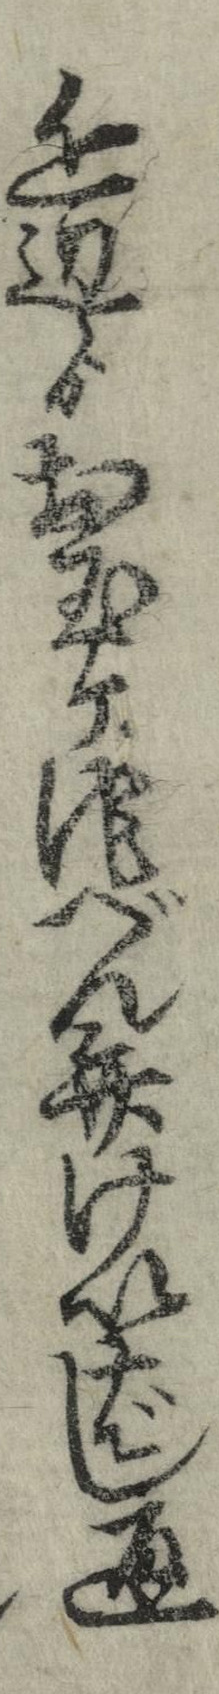近辺ゟお玉ケ池べん弁けいばし通
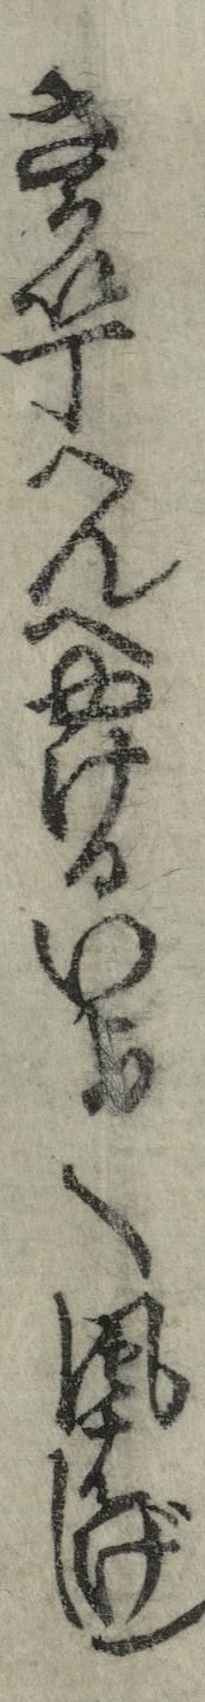さかい丁へんへやけるいよ〻風はげし
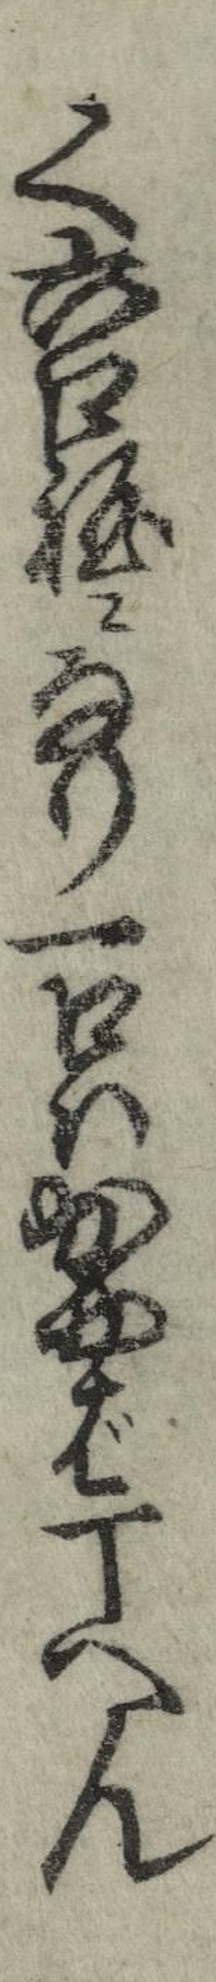く六口程ニなり一口はかやば丁へん
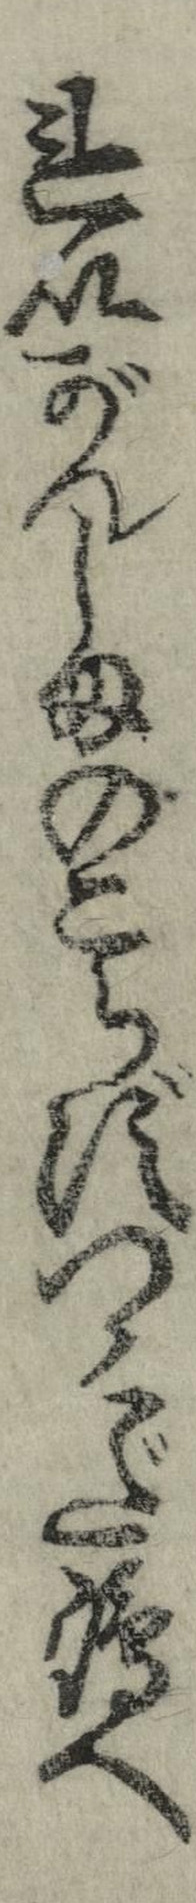れいがんしまのこらずつくだ橋へ
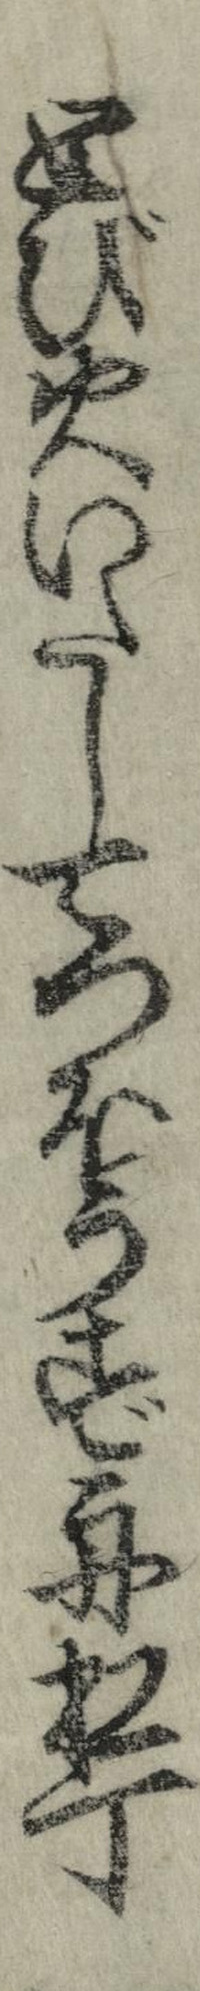とび火いたしてつほうず舟松丁
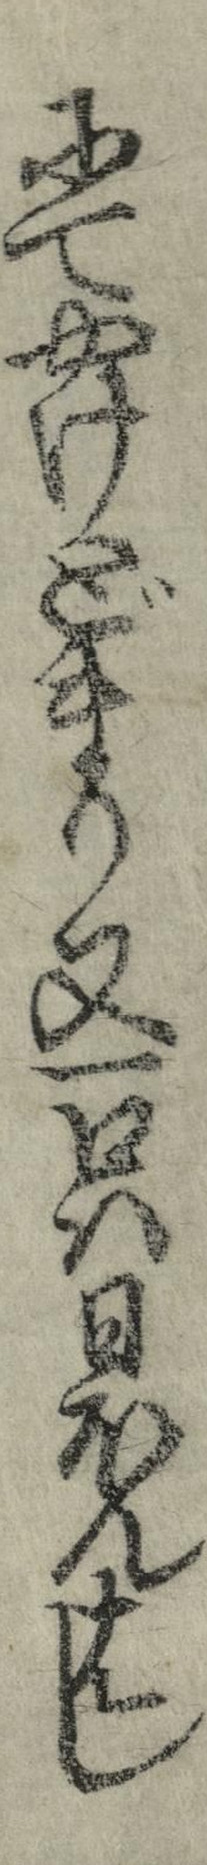にてやけどまり又一口は日ほんはし
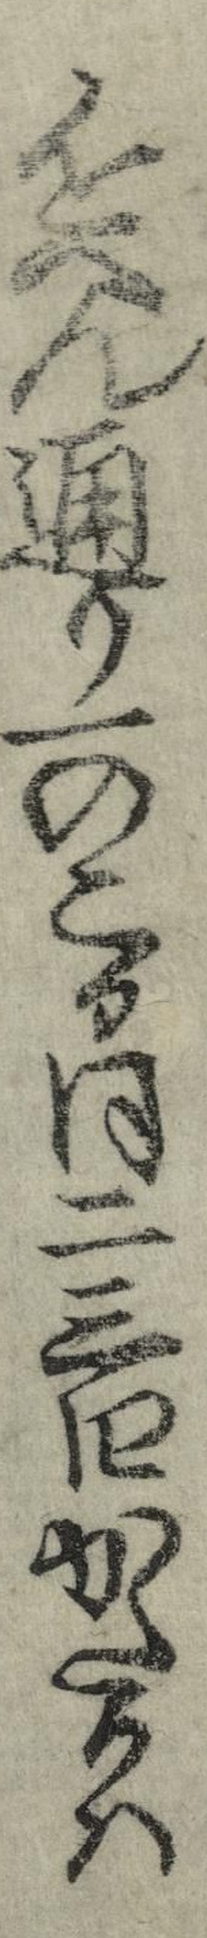近へん通り一のこる同二三四かたかは
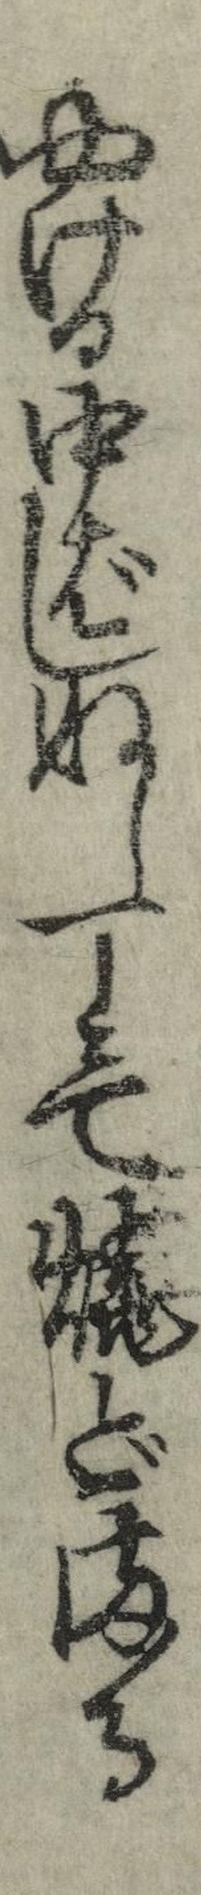やける中ばしぬし丁にて焼どまる
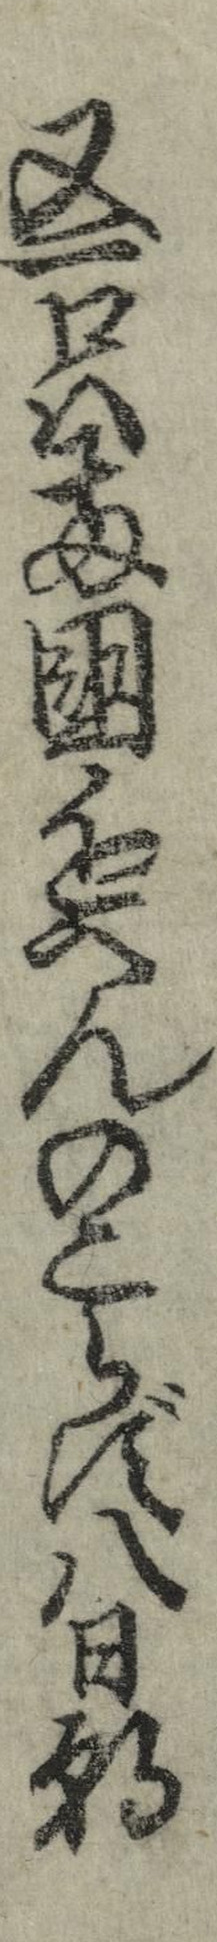又二口は両国近へんのこらず八日朝
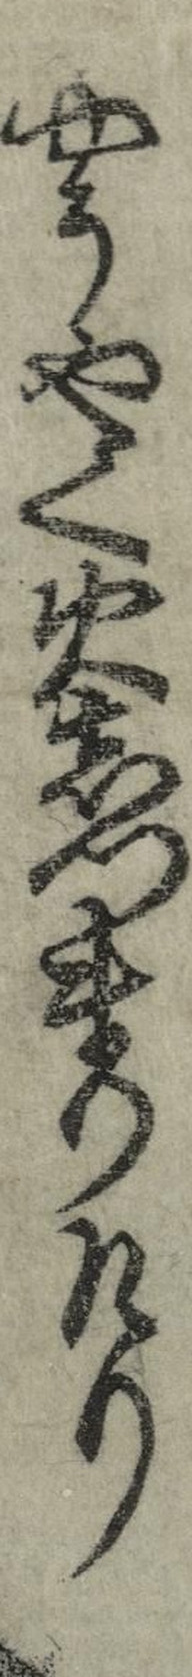やうやく火しつまりけり
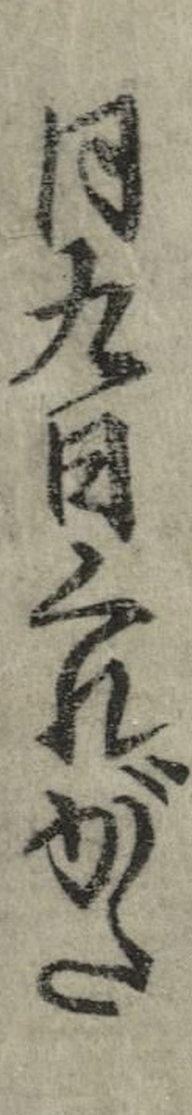同九日くれがた
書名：方角繪圖面
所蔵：東京大学地震研究所図書室 Earthquake Research Institute Library, The University of Tokyo, JAPAN
